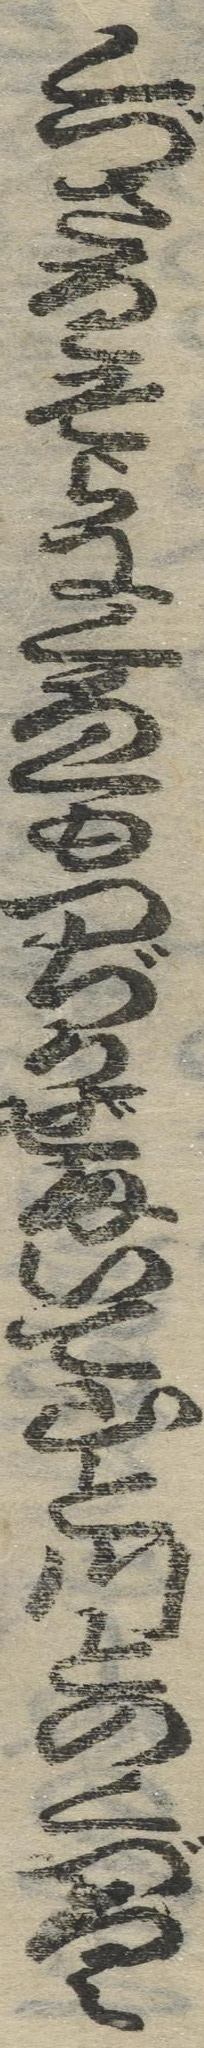くづさるゝそらにくろくもつぢかぜまいて山と川とのくづるゝ
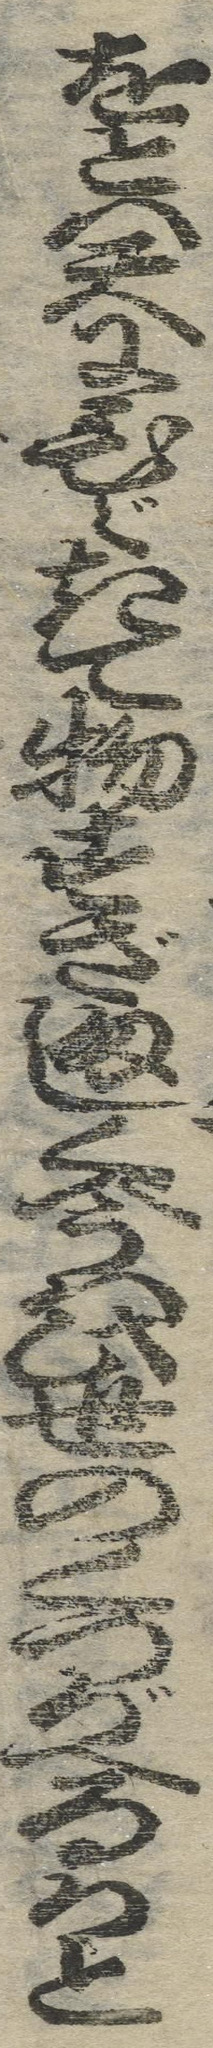をとは天にひゞきて物すざましく今は此世のくづがへるかと
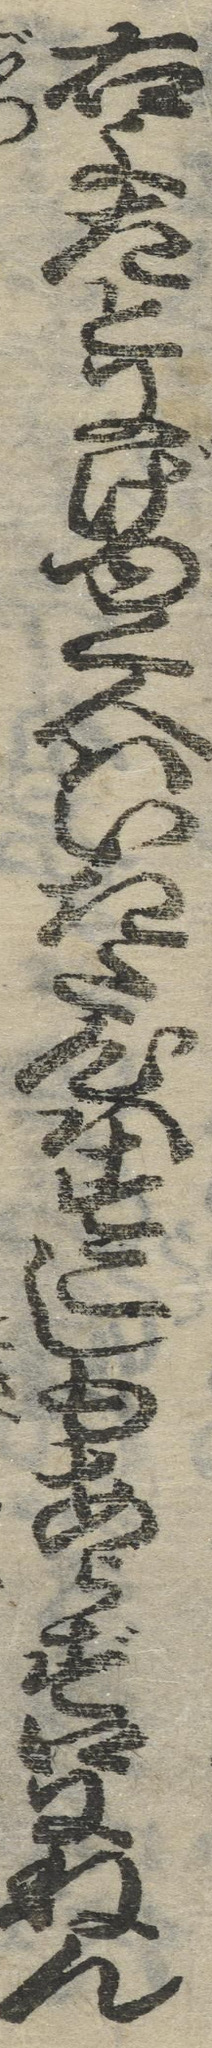右よ左とにげゆく人はいきた心はすこしもあらず口にねん
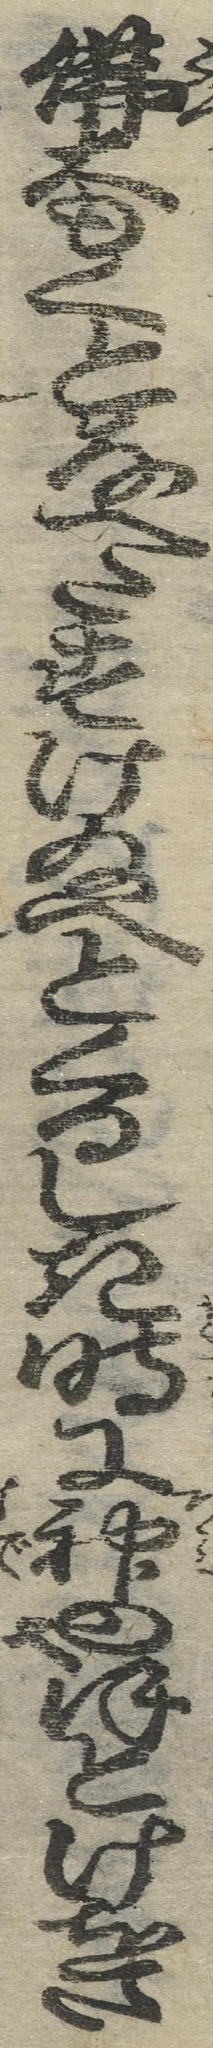佛大もくとなへたすけ給へとくるしき時に神やほとけをた
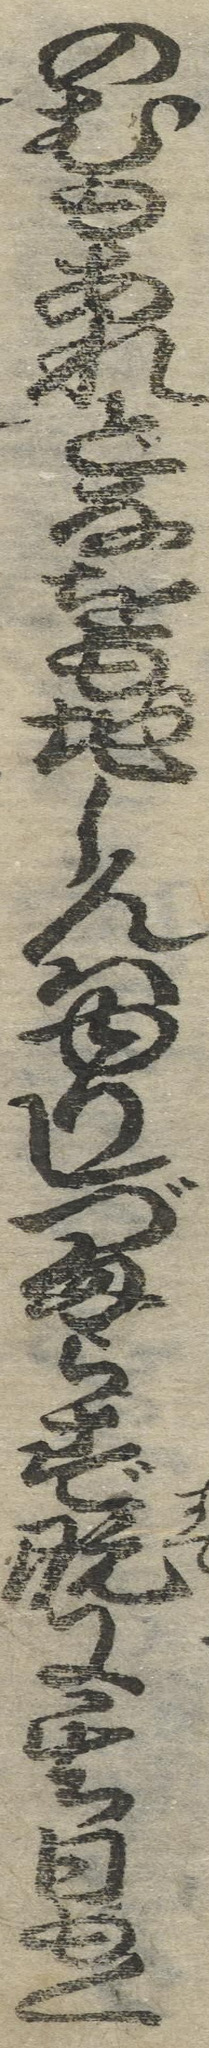のむもあれどなをも地しんはゆりしづまらず既に其日もく
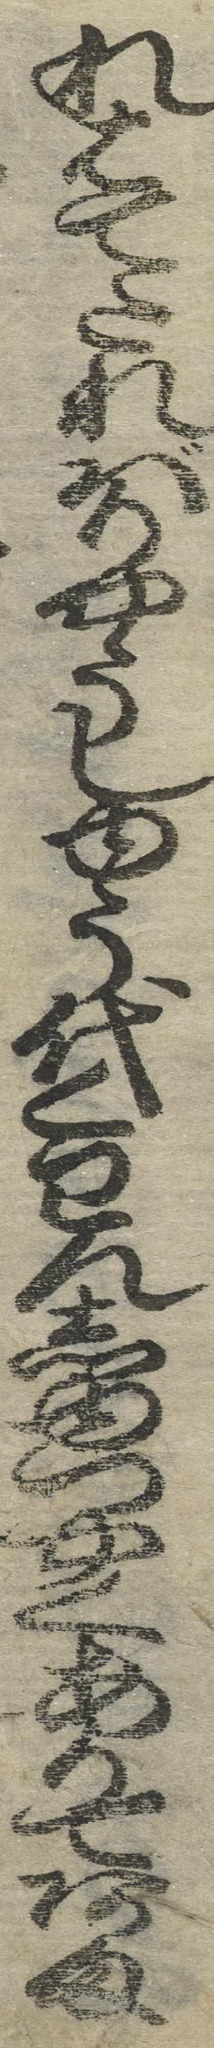れはてたればりやうしゆう代くわんしゆつやくありてあま
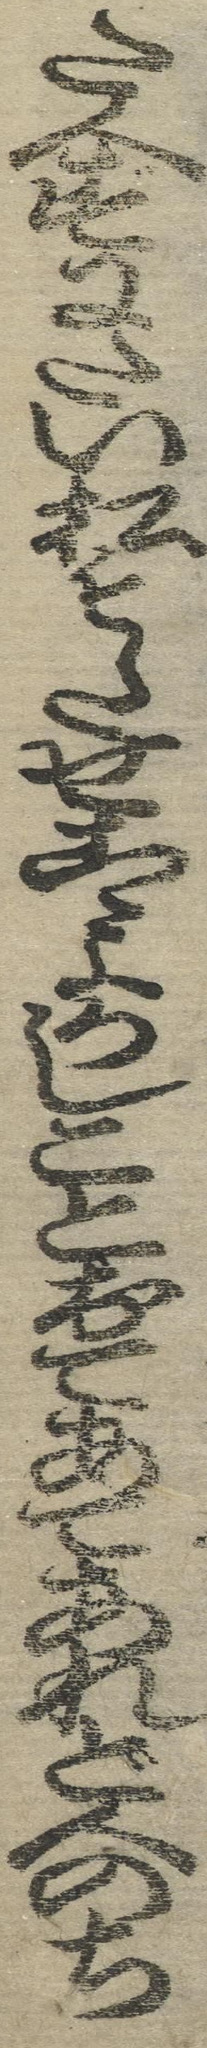た人ずにたい松もたせこゝよかしことおてあてあれど人のち

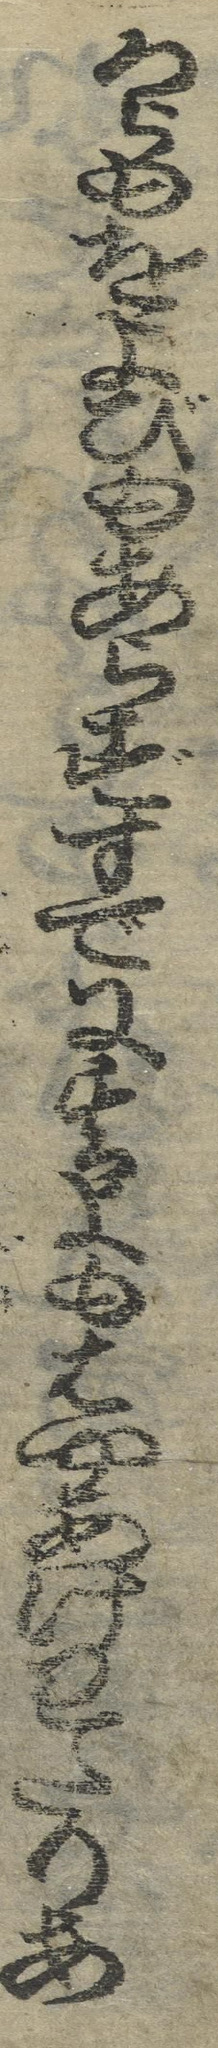からもをよびもあらずすでに其よもはやあけわたりあ
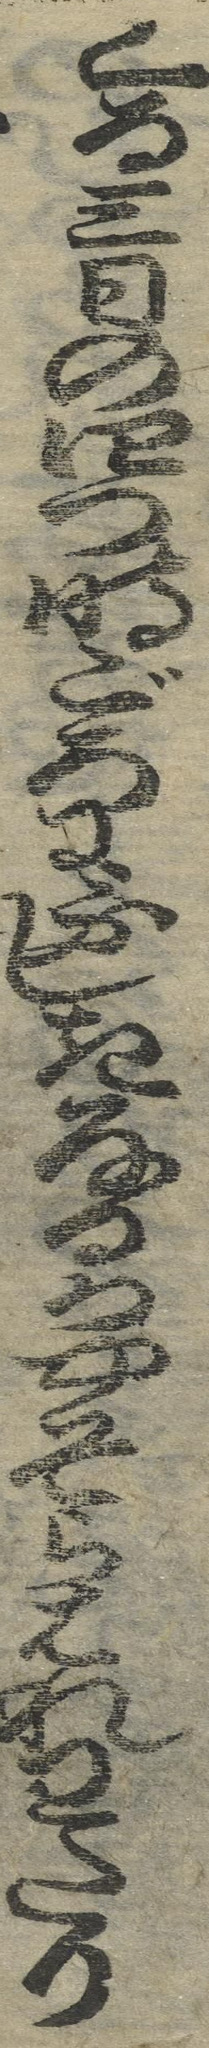くる三日の四つ時ごろにふしきなるかやそらはれわたり
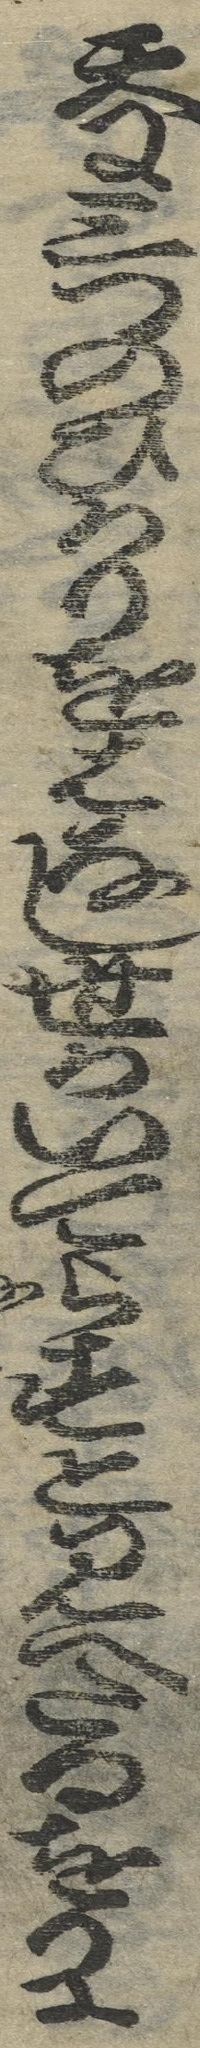天に三つのひかりをはなし世かいてらすと見へたるをりに
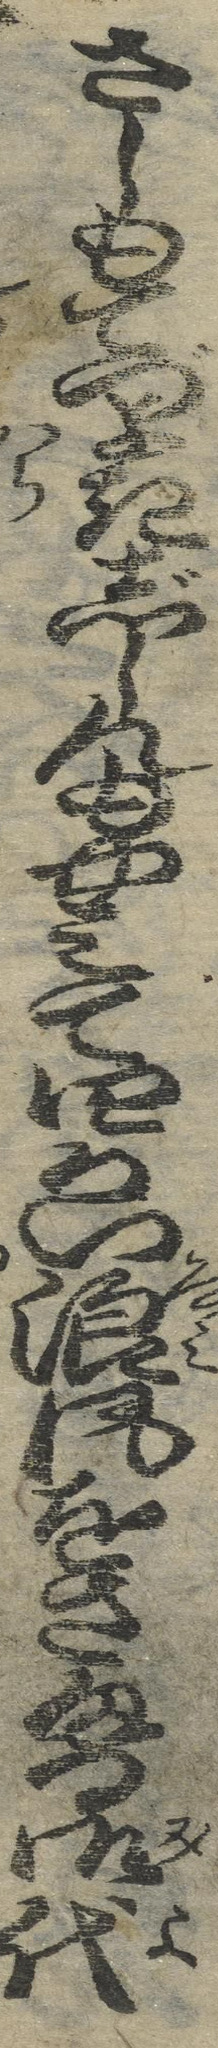さしもてづよきじぢんもやみて四かい浪風をさまる御代
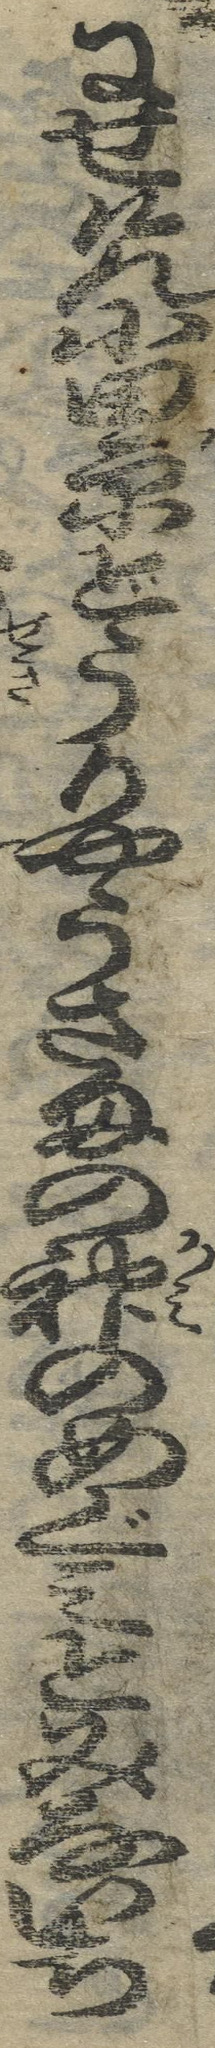にせけん小田原どうりやうさまの神のめぐみとみないち
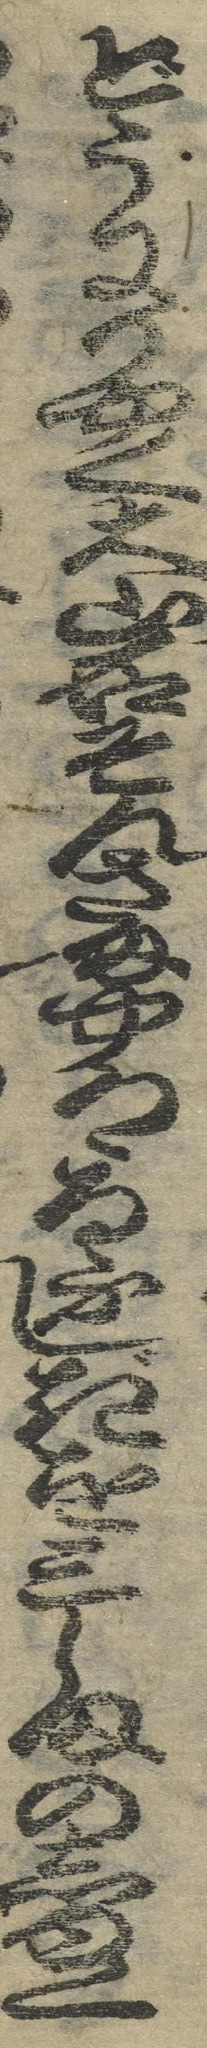どうにりやく大山石そんさまよかゝるふしぎを三しまのしゆく
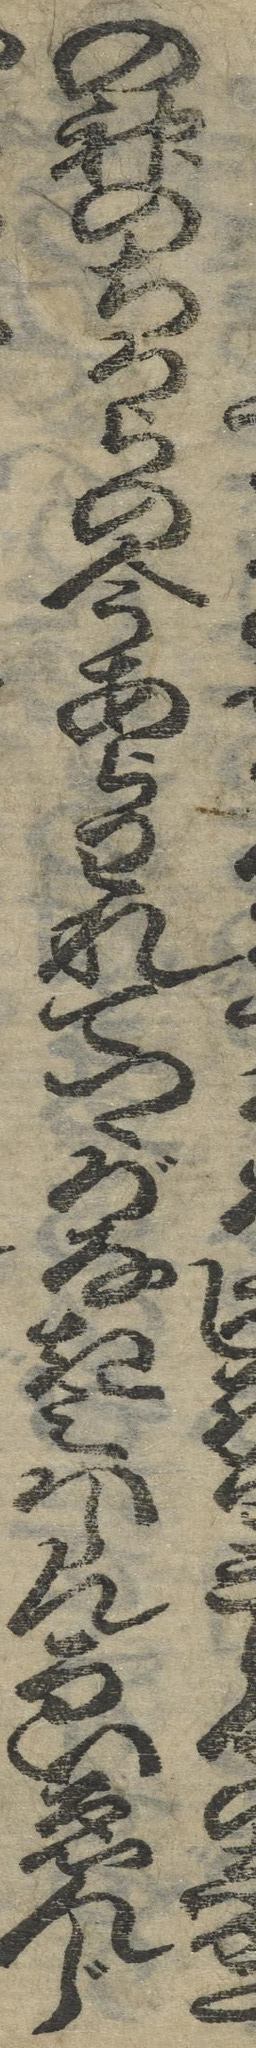の神のちからの今あらわれてつゝがなきみはしんるいゑんじ
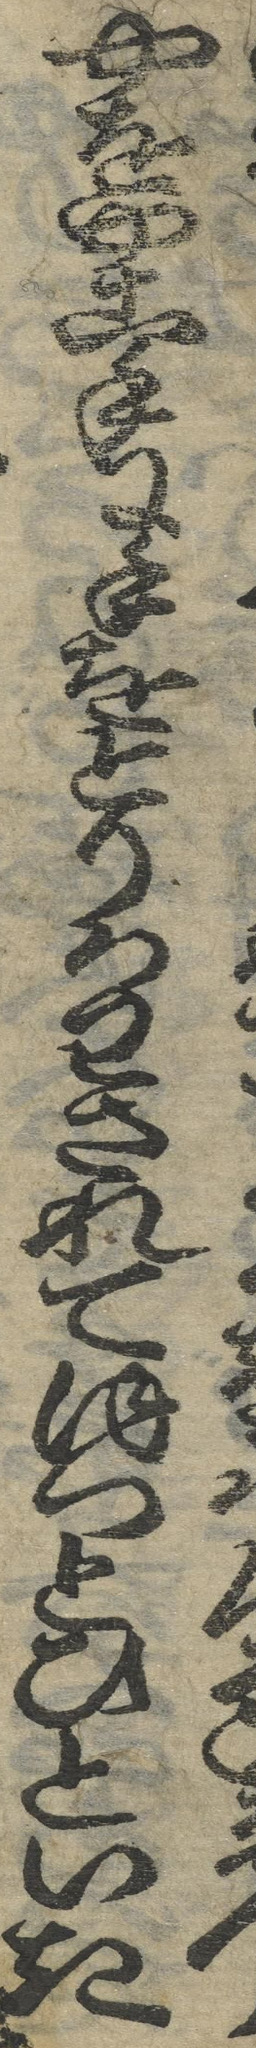やをやこ手に手をとりかわされてほつとひといき
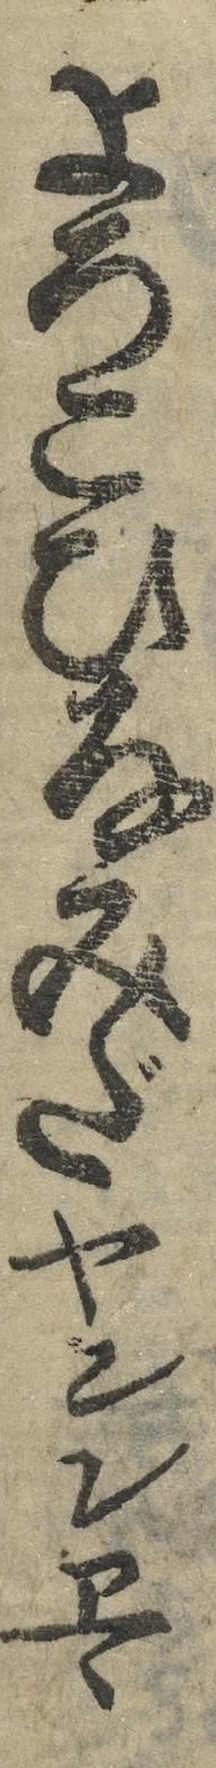よろこひなみだヤンレエゝ
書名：相州小田原箱根地震くどき
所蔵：東京大学地震研究所図書室 Earthquake Research Institute Library, The University of Tokyo, JAPAN
